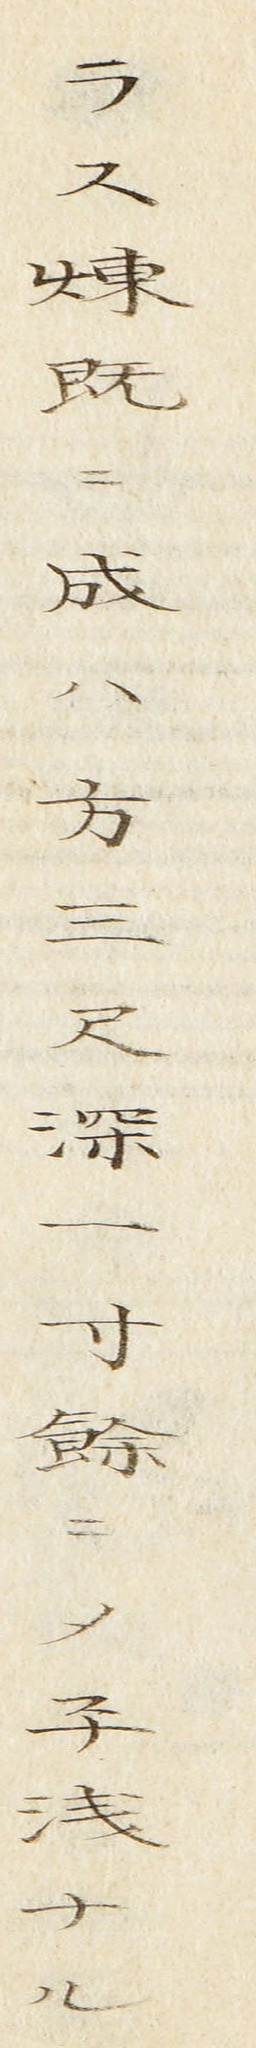ラス煉既ニ成ハ方三尺深一寸余ニシテ浅ナル
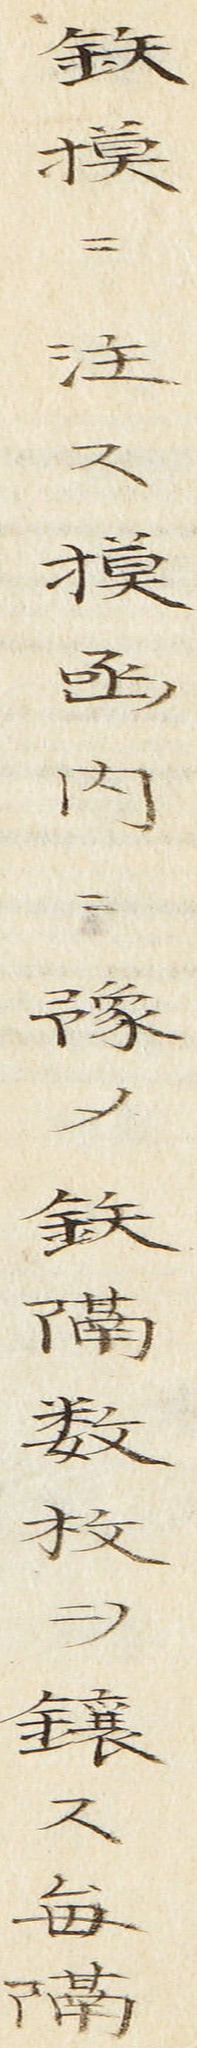鉄模ニ注ス模函内ニ予シテ鉄数枚ヲ鑲ス毎
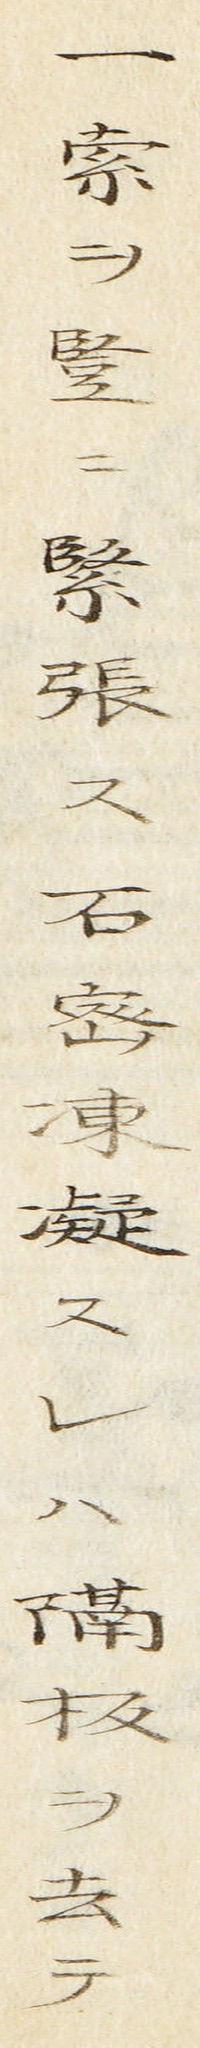一索ヲ豎ニ緊張ス石密凍凝スレハ板ヲ去テ
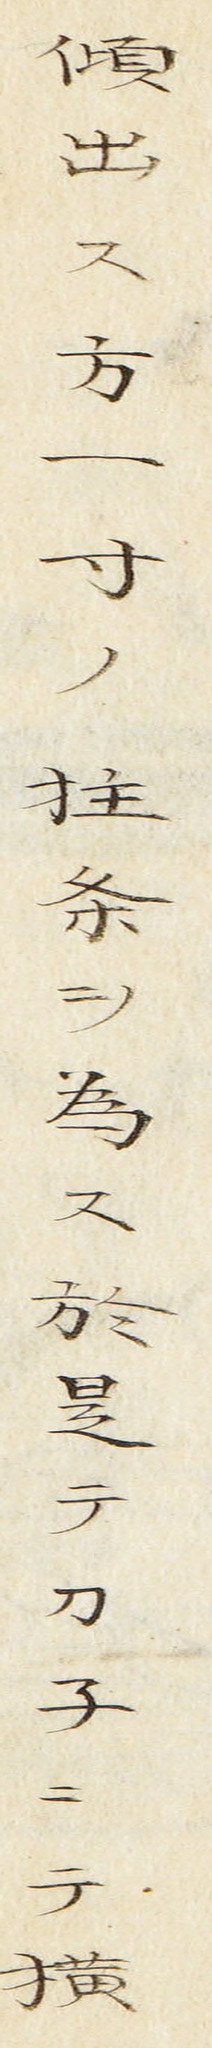傾出ス方一寸ノ柱条ヲ為ス於是テ刀子ニテ横
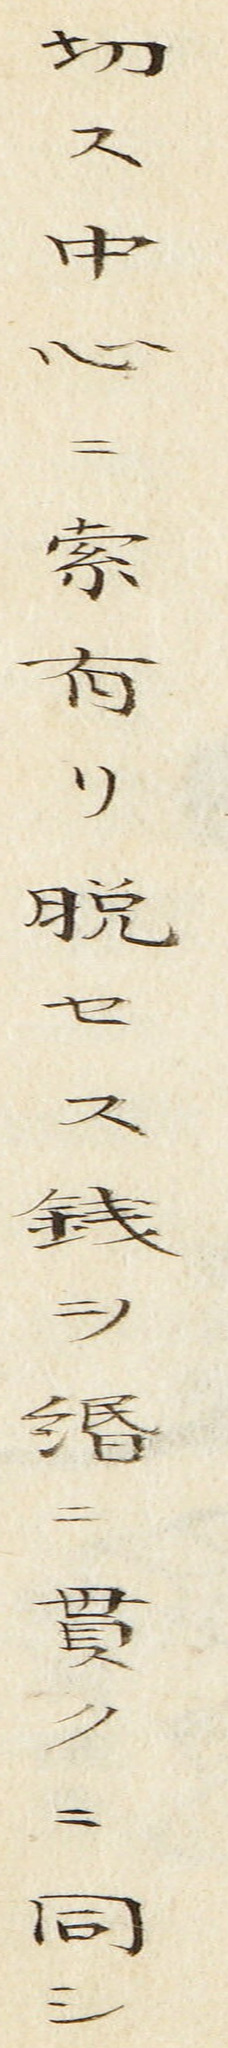切ス中心ニ索有リ脱セス銭ヲ緡ニ貫クニ同シ
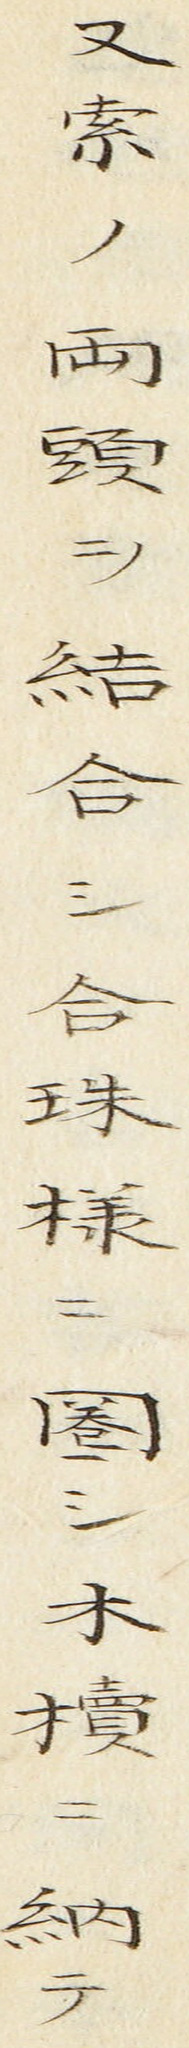又索ノ両頭ヲ結合シ合珠様ニ圏シ木櫝ニ納テ

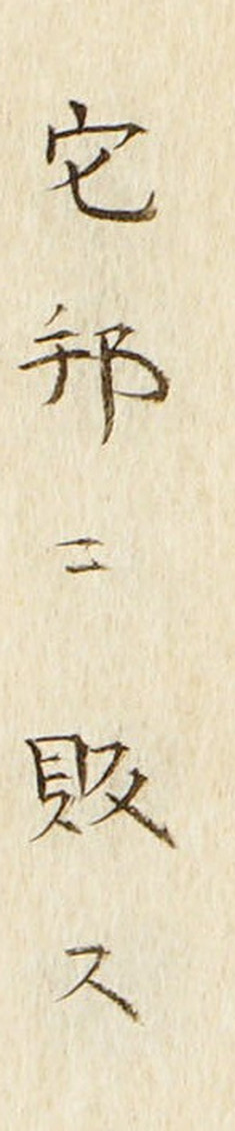它邦ニ販ス
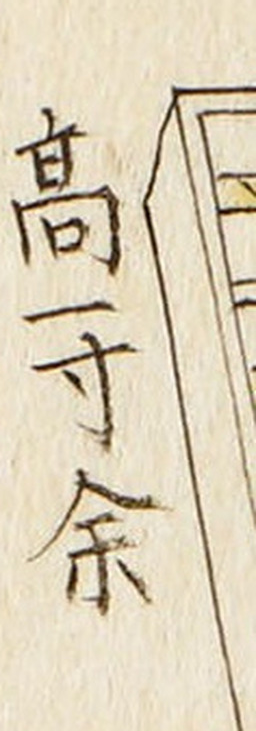高一寸余
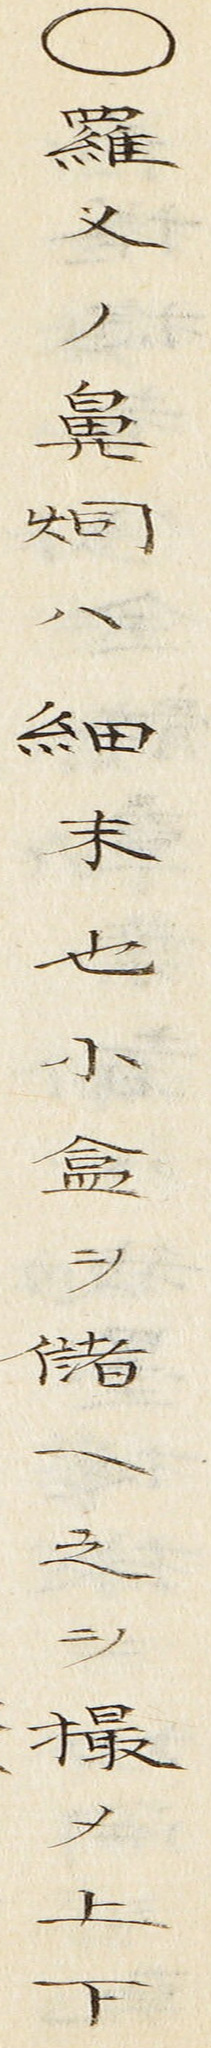〇羅又ノ鼻烟ハ細末也小盒ヲ儲ヘ之ヲ撮シテ上下
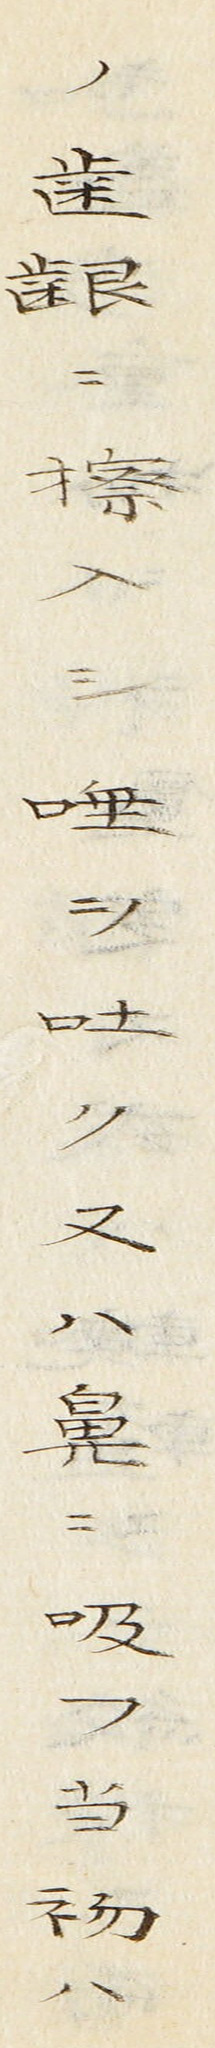ノ歯齦ニ擦入シ唾ヲ吐ク又ハ鼻ニ吸フ当初ハ
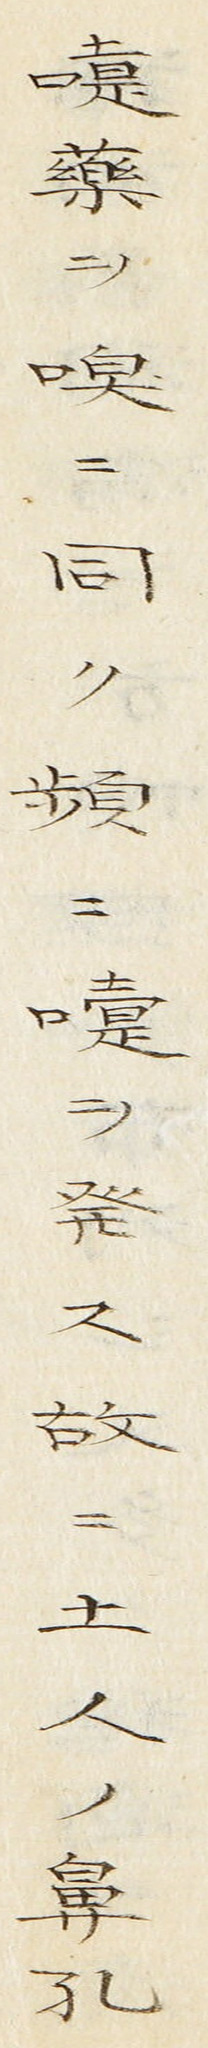嚏？薬ヲ嗅ニ同ク頻ニ嚏ヲ発ス故ニ土人ノ鼻孔
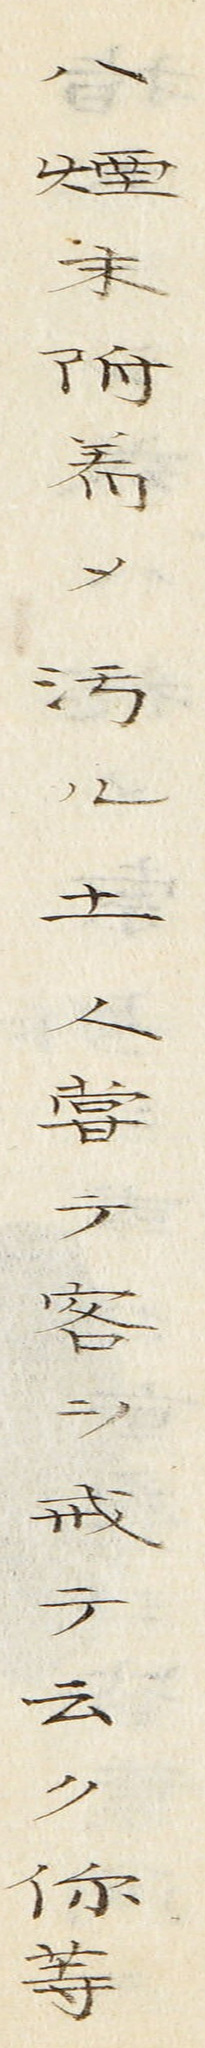ハ煙末付着シテ汚ル土人嘗テ客ヲ戒テ云ク你等
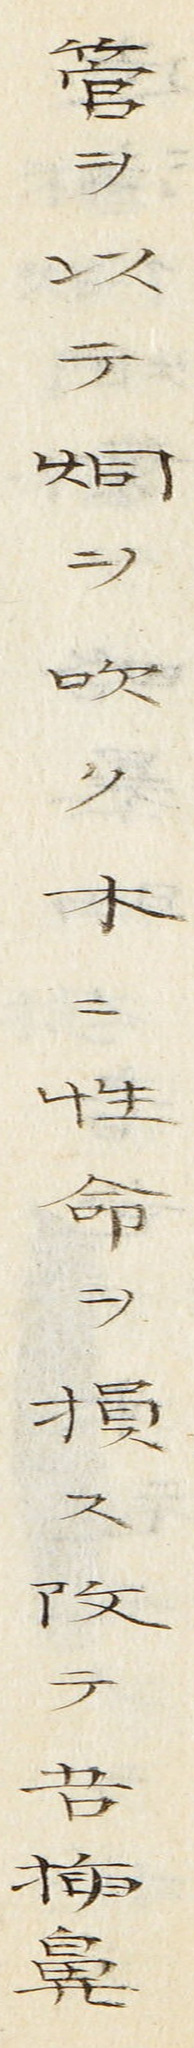管ヲ以テ烟ヲ吹ク木ニ性命ヲ損ス改？テ吾挿鼻
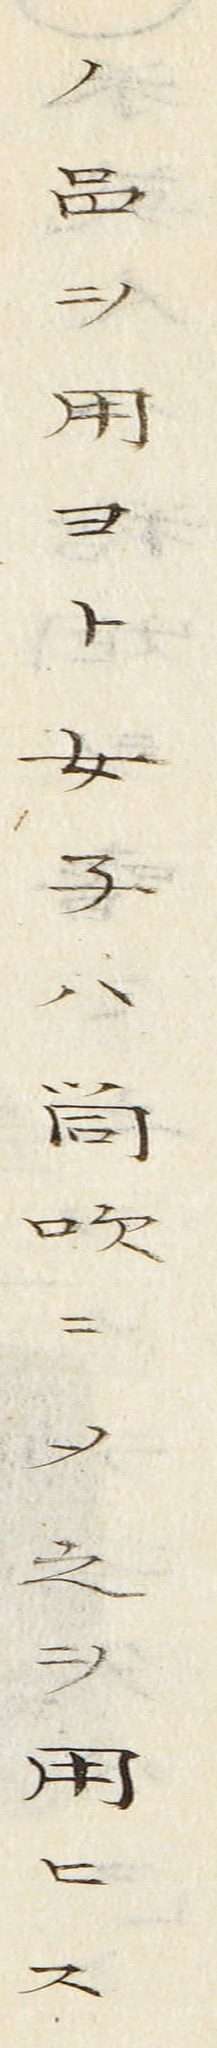ノ品ヲ用ヨト女子ハ筒？吹ニシテ之ヲ用ヒス
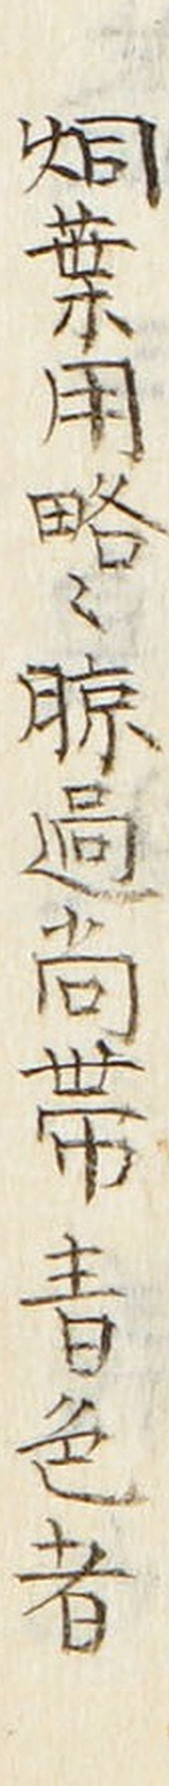烟葉用略ゝ晾？過尚帯青色者
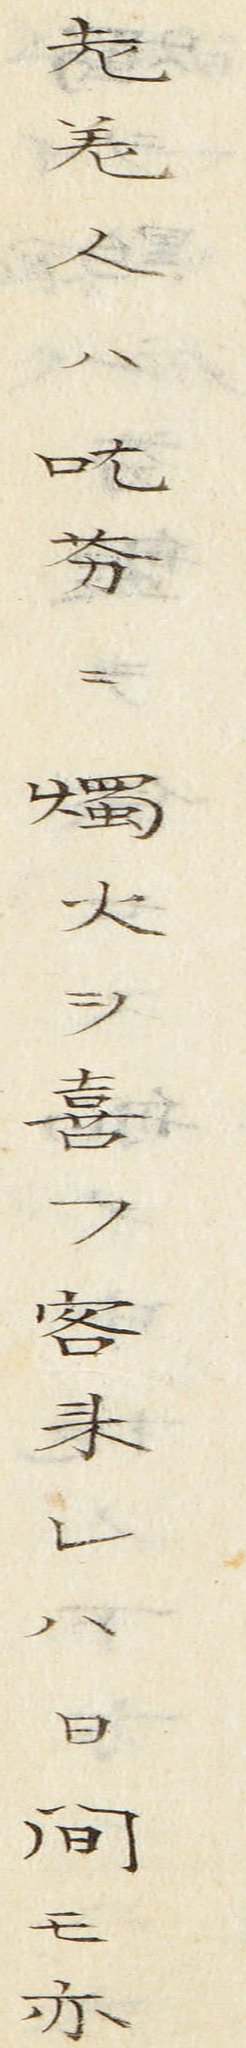老羌？人ハ吃？芬ニ燭火ヲ喜フ客来レハ日間モ亦
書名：蕃談
